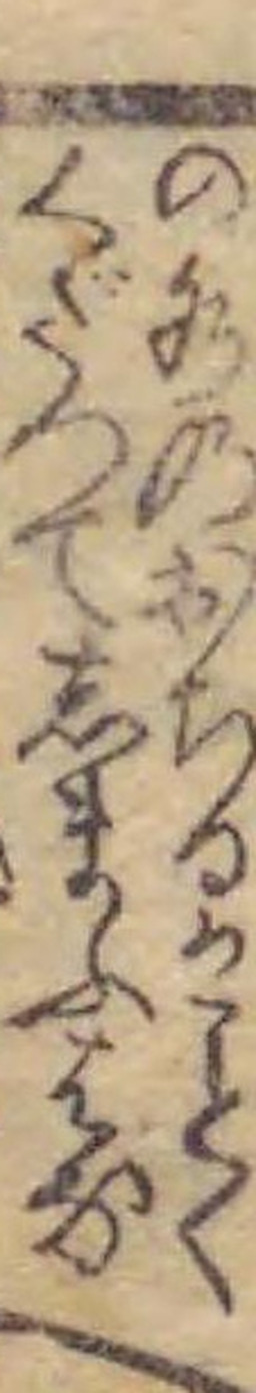くだつてしまふはな
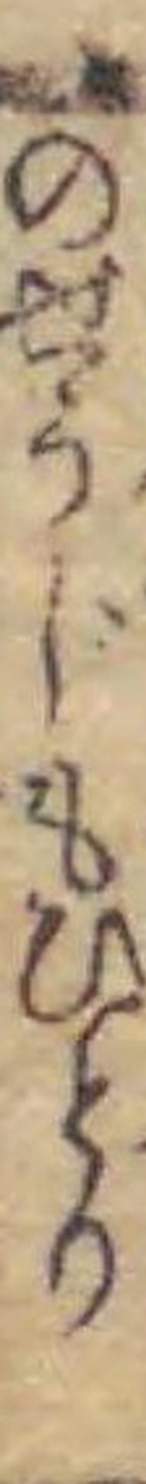のせうじもひとり
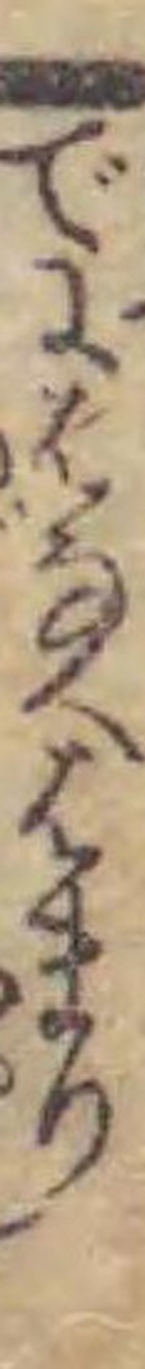でにはなへはまり
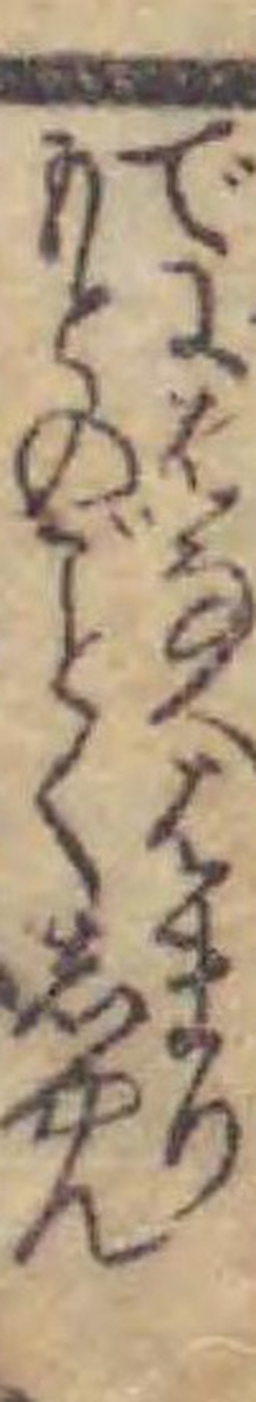もとのごとくしやん
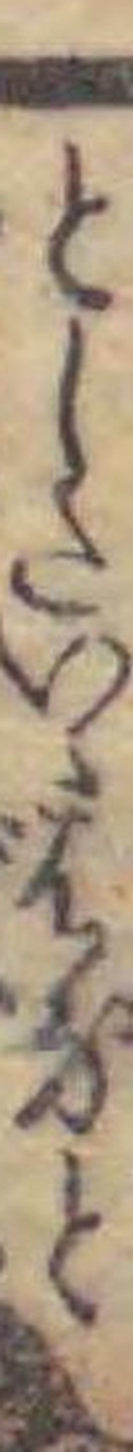としたいはなと
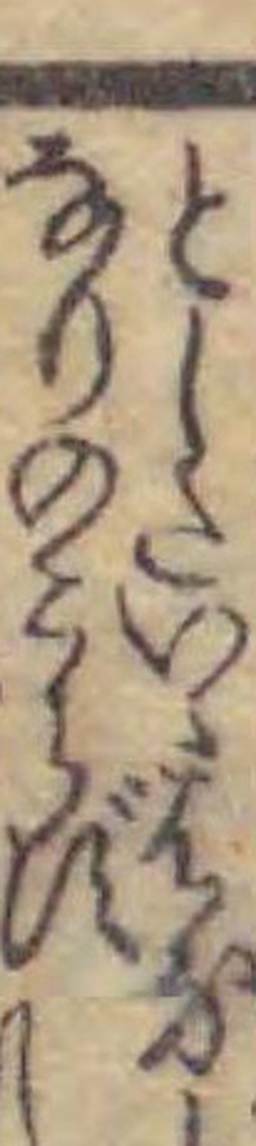なりのこらず
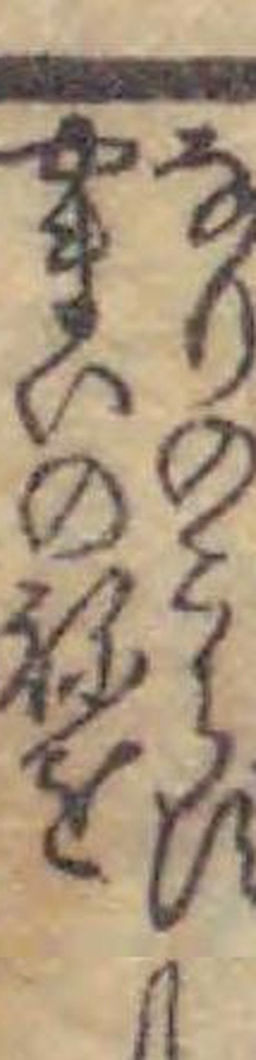やまいのねを
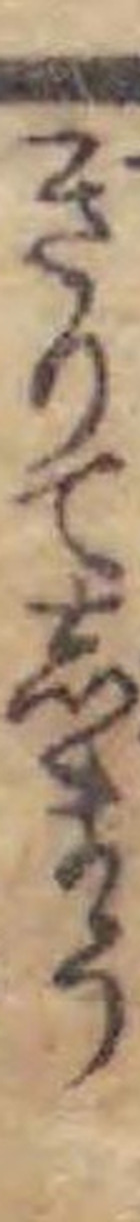きりてしまう
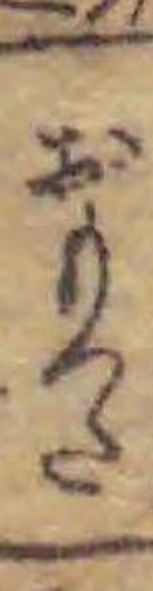おもつた
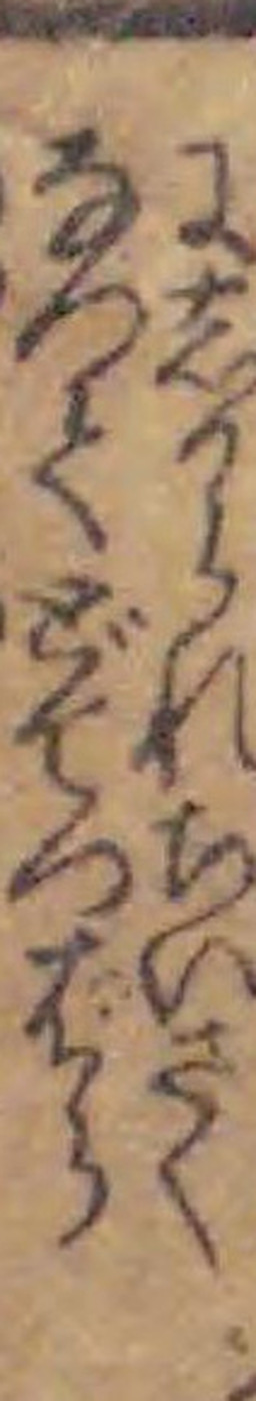なつてどてつばら
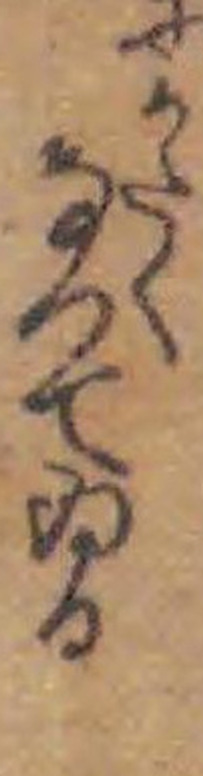なつてゐる

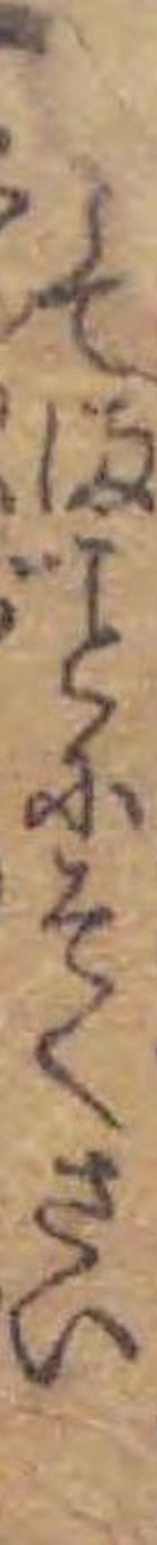してまことにそくさい
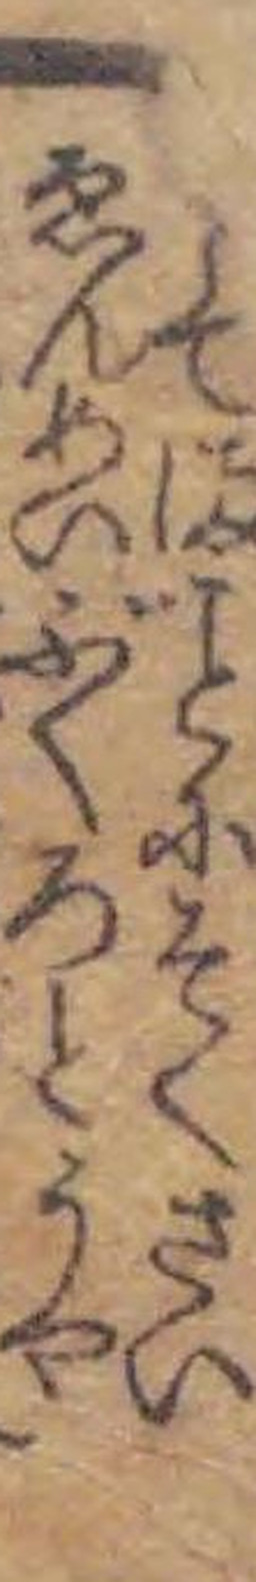ゑんめいぶくろとうや
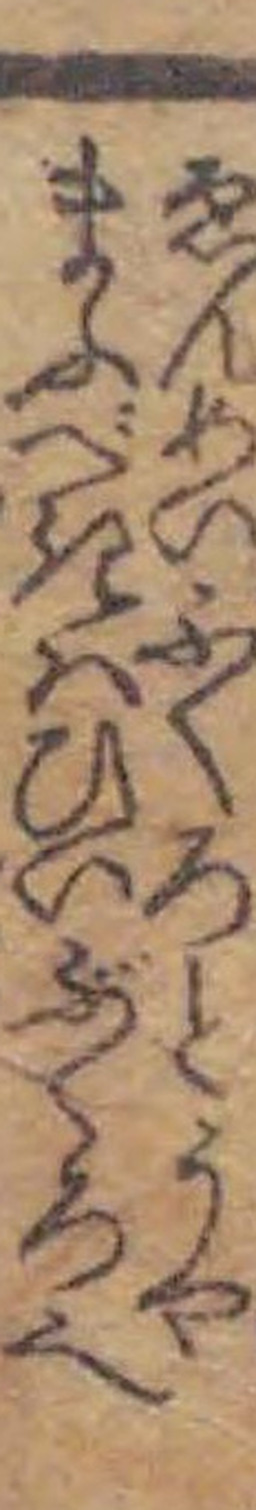まふべきはひいぶくろ也
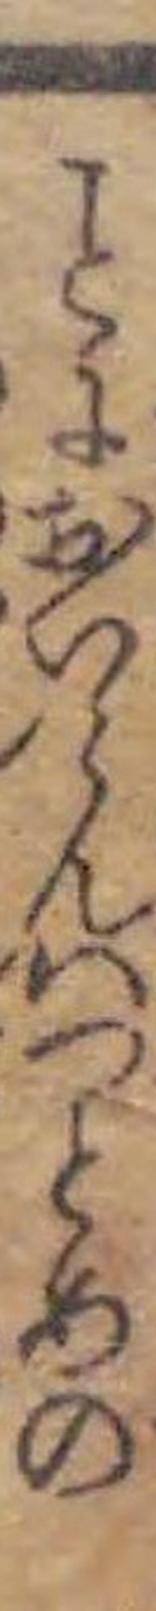ことにおいらんはつとめの
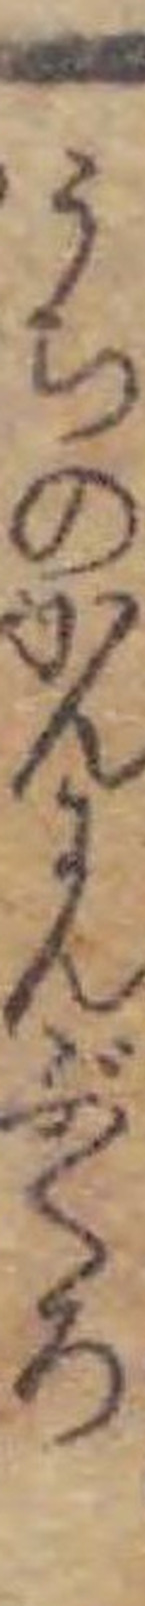うちのかんにんぶくろ
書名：十四傾城腹之内 : 3巻
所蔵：国立国会図書館 National Diet Library, JAPAN
